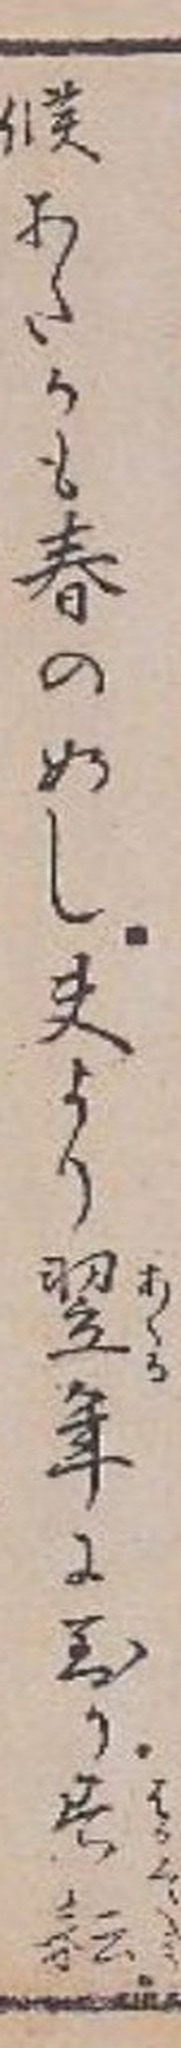候あたかも春の如し、夫より翌年に到り、春耘、
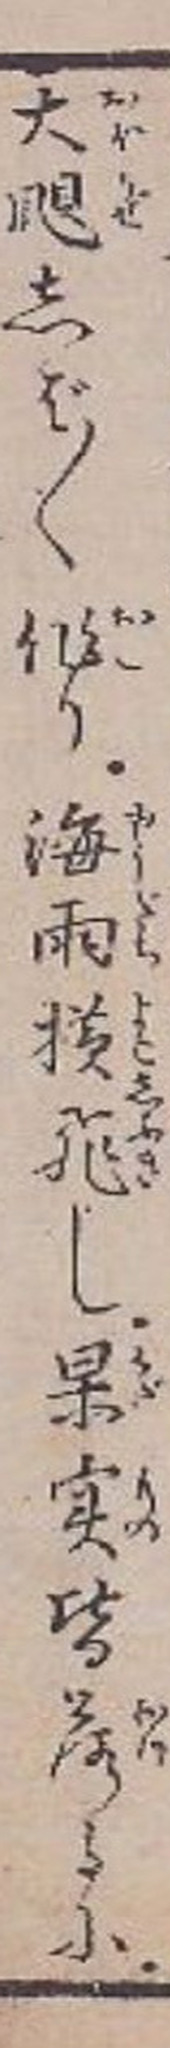大颶しば〳〵作り、海雨横飛し、果実皆落るに、
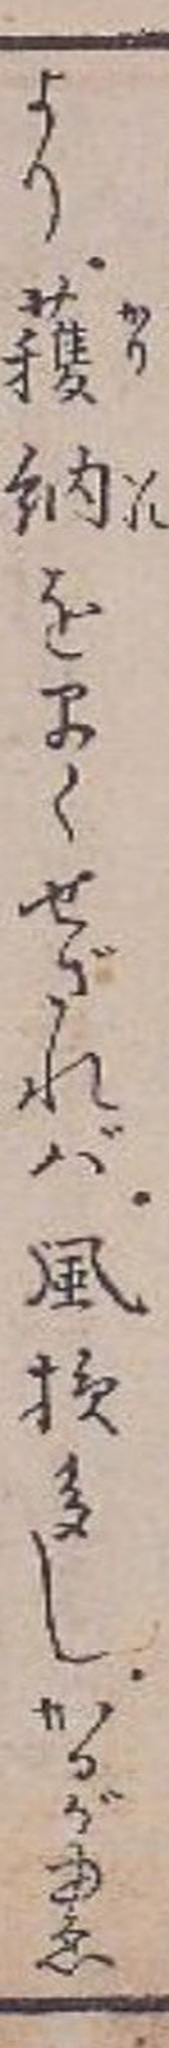より、穫納を早くせざれば、風損多し、かるがゆゑ
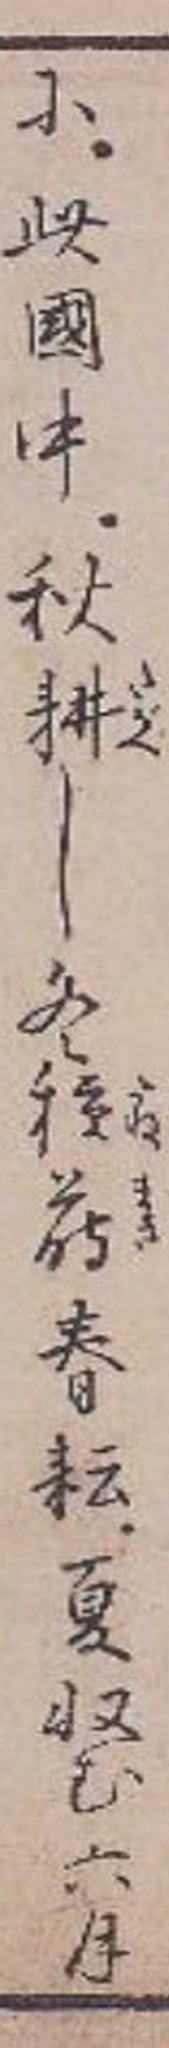に、此国中、秋耕し冬種蒔春耘、夏収む六月
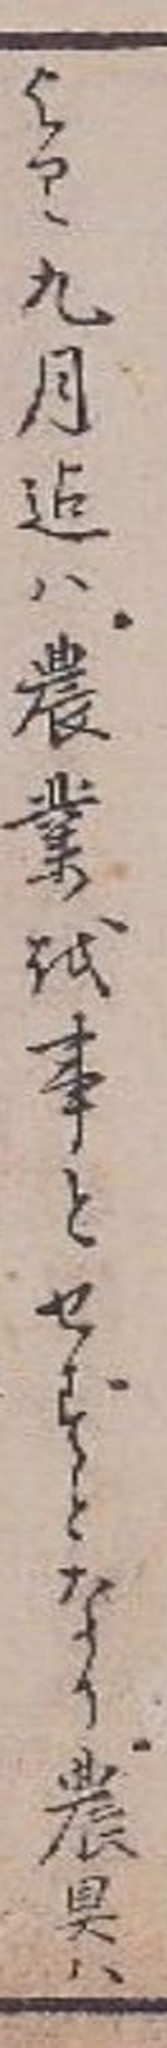より九月迄は、農業を事とせずとなり、農具は
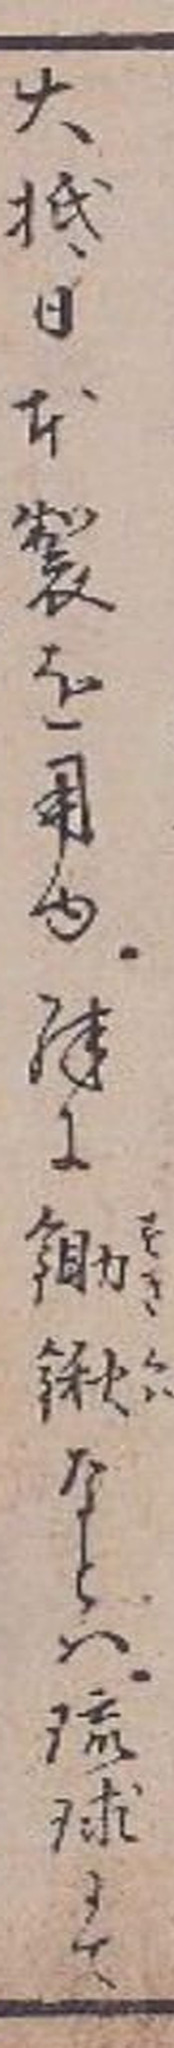大抵日本製を用ゆ、殊に鋤鍬なとは、琉球にて
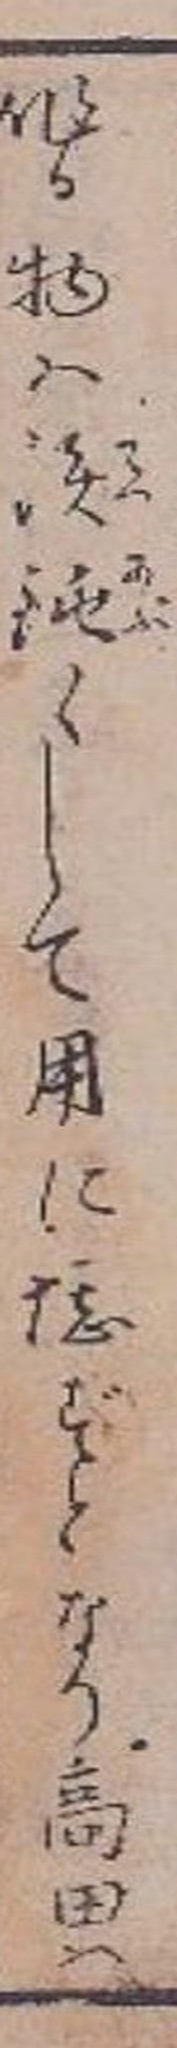作る物は鉄鈍くして用に堪ずとなり、高田は

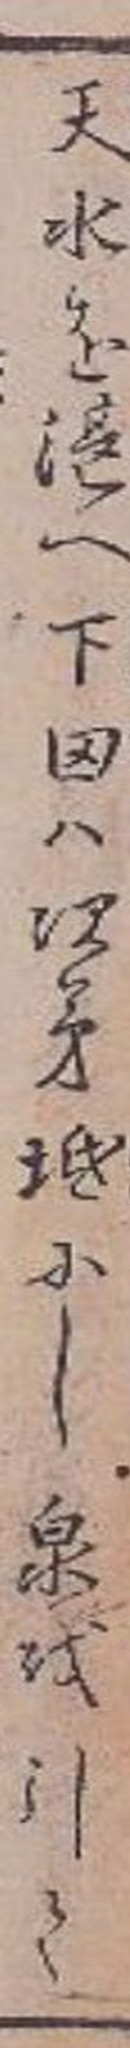天水を湛へ、下田は次第坻にし、泉を引て
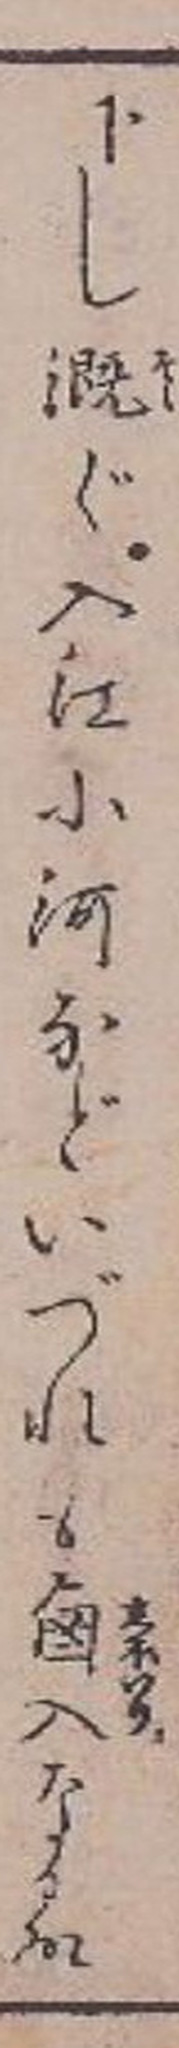下し漑ぐ、入江小河などいづれも鹵入なる故
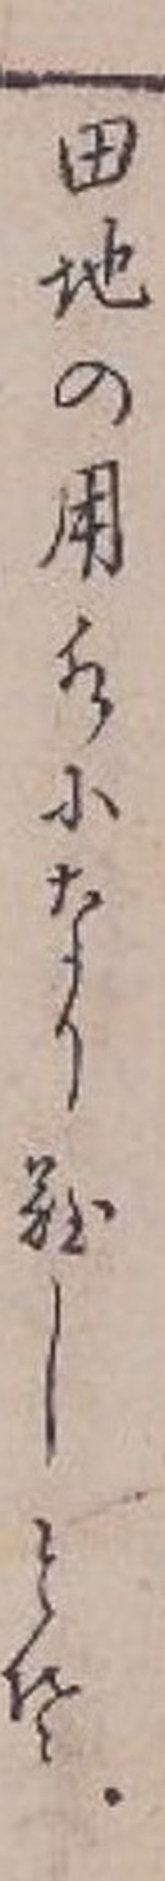田地の用水になり難しとそ、
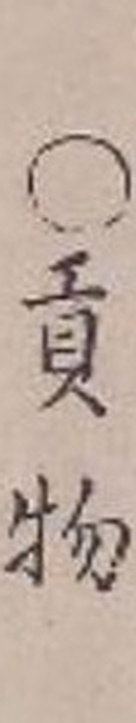○貢物
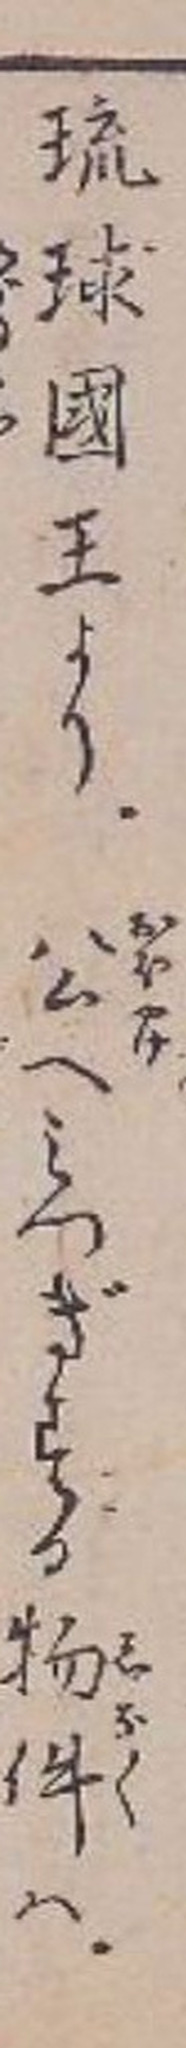琉球国王より、公へみつぎする物件は、
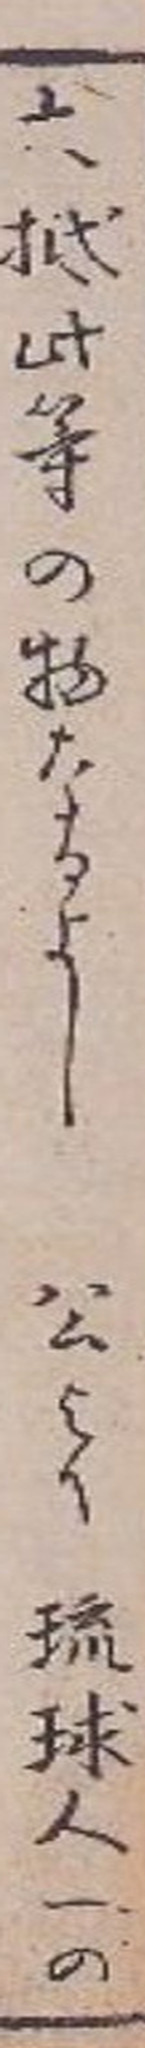大抵此等の物なるよし公より琉球人への
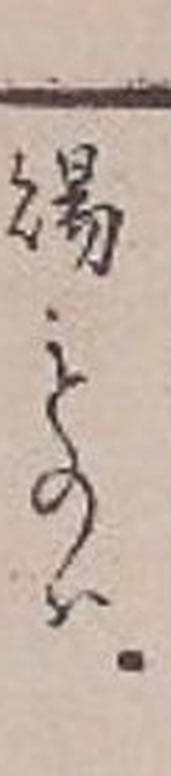賜ものは、
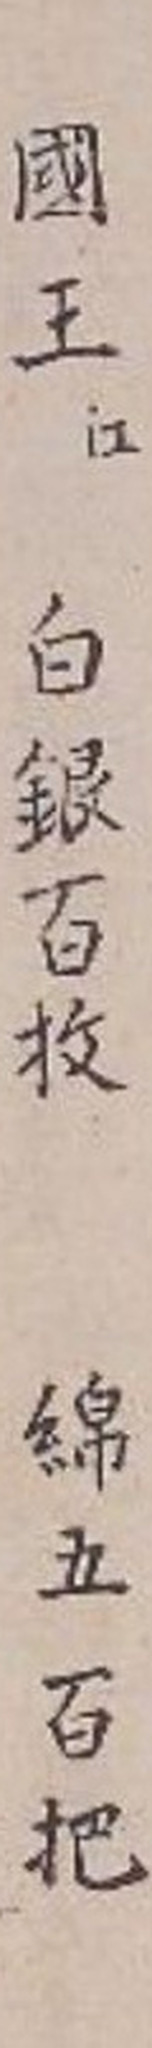国王え白銀百枚綿五百把
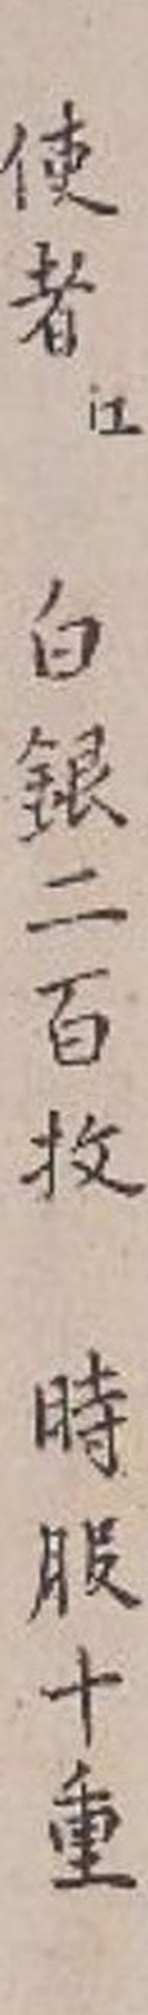使者え白銀二百枚時服十重
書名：琉球談
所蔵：University of the Ryukyus Library
